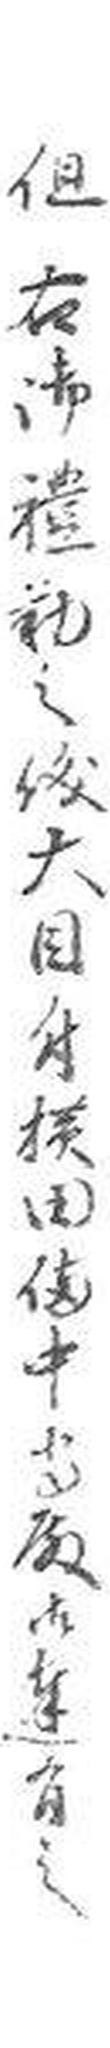但右御廻勤之儀大目付横田備中守殿御達有之
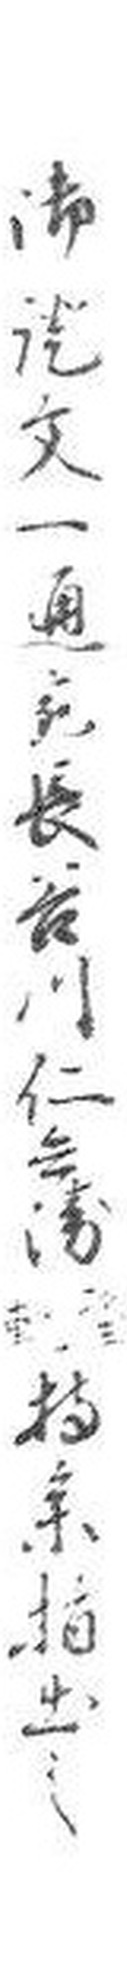御証文一通宛長谷川仁兵衛澄持参指出之
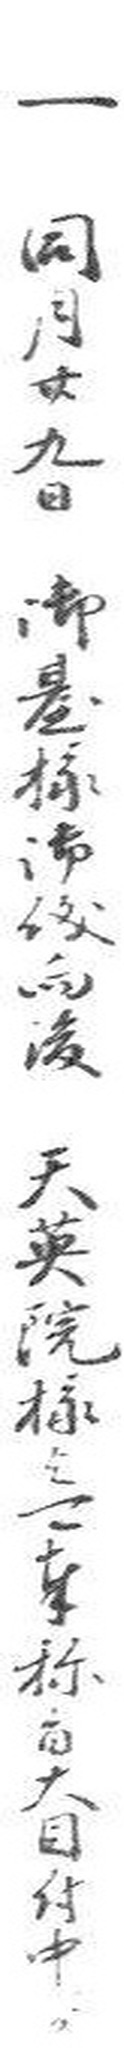一同二十九日御台様御儀向後天英院様与可奉称旨大目付中ゟ
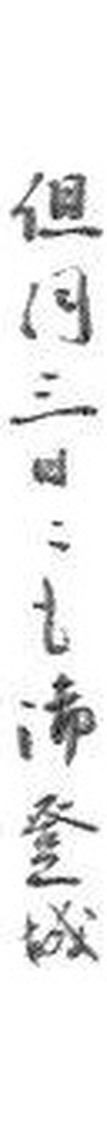但同三日ニも御登城
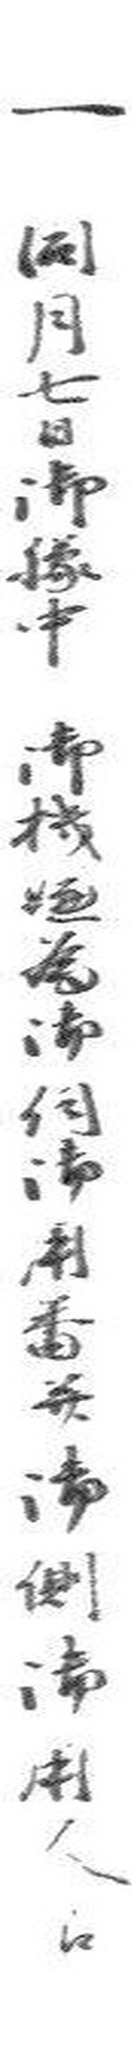一同月七日御蒙中御機嫌為御伺御用番并御側御用人江
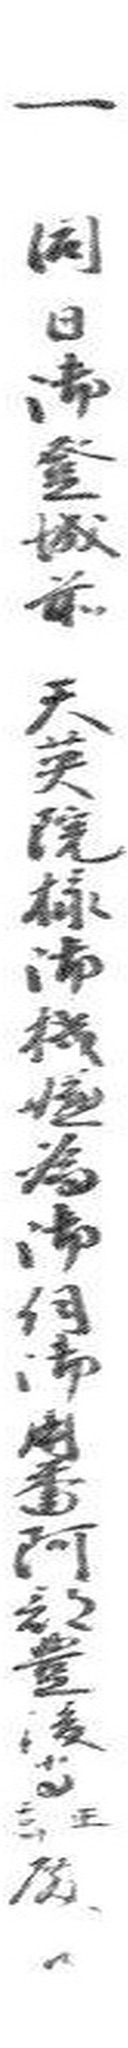一同日御登城前天英院様御機嫌為御伺御用番阿部豊後守正喬殿江
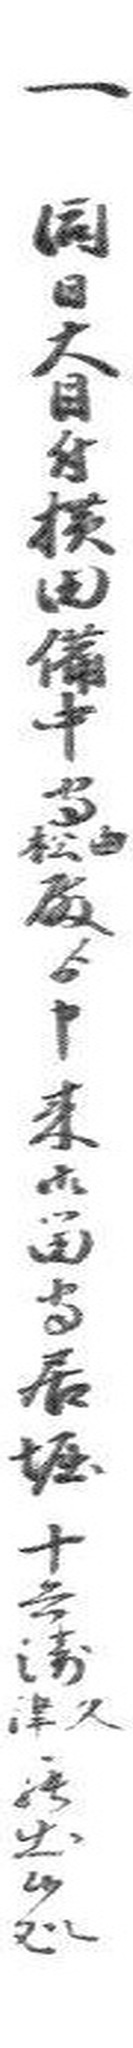一同日大目付横田備中守由松殿ゟ申来御留守居堀十兵衛久律罷出候
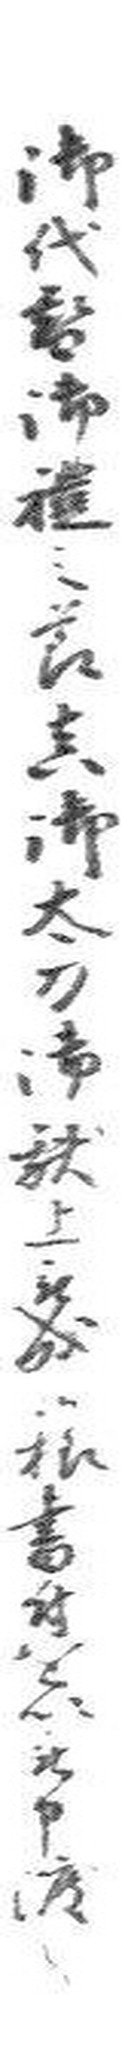御代替御礼之節御太刀御献上被成候様書付を以被申渡之

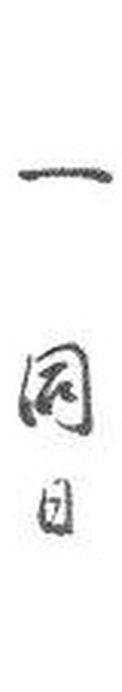一同日
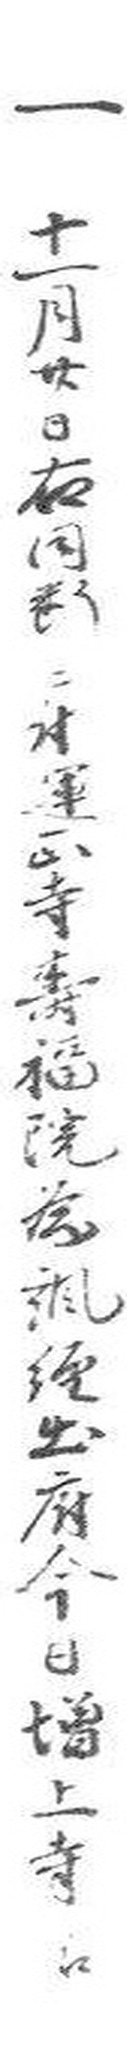一十一月廿日右同断ニ付運正寺壽福院為諷経出府今日増上寺江
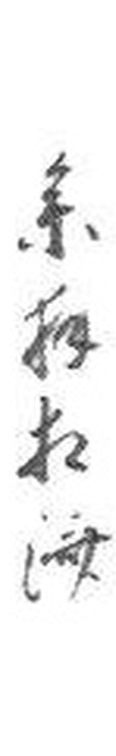参拝相済
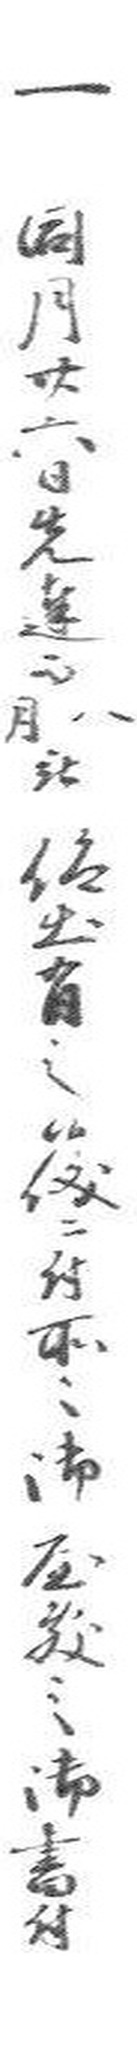一同月廿六日先達而八月被仰出有之候儀ニ付所々御屋敷之御書付
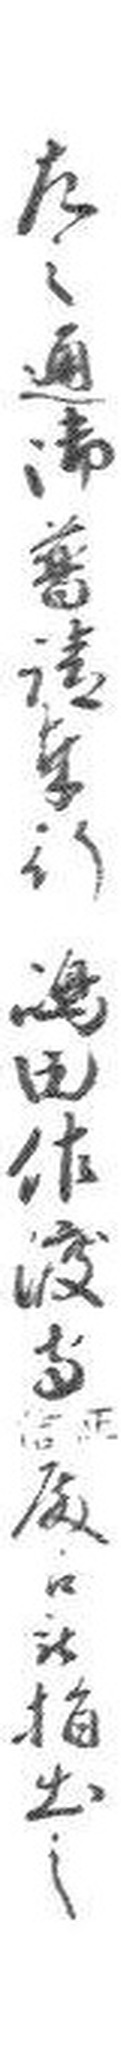左之通御普請奉行嶋田佐渡守正富殿江被指出之
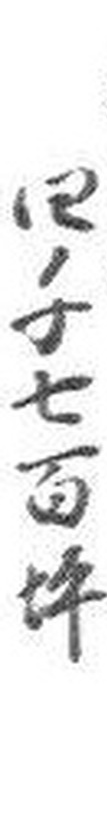四千七百坪
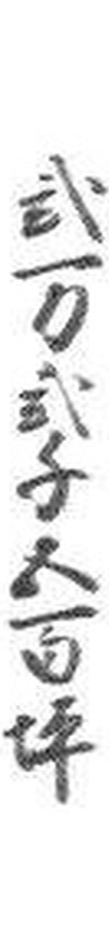弐万弐千五百坪
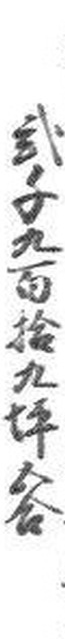弐千九百拾九坪五合
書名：家譜 二十九 吉邦公 従正徳二年到正徳三年
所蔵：福井県文書館 Fukui Prefectural Archives
